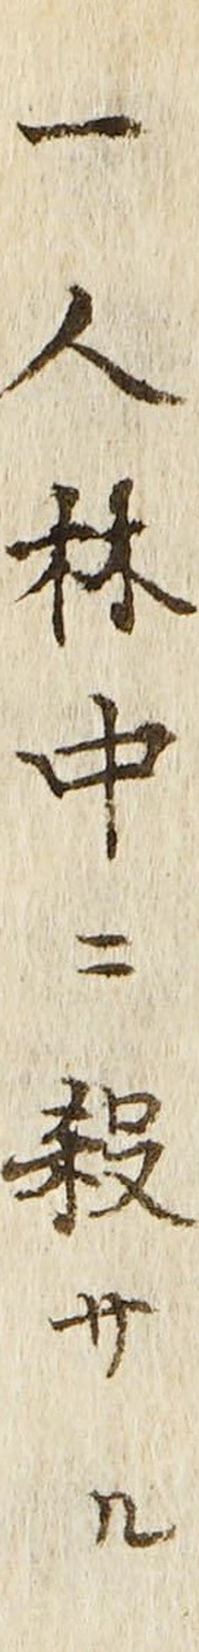一人林中ニ殺サル
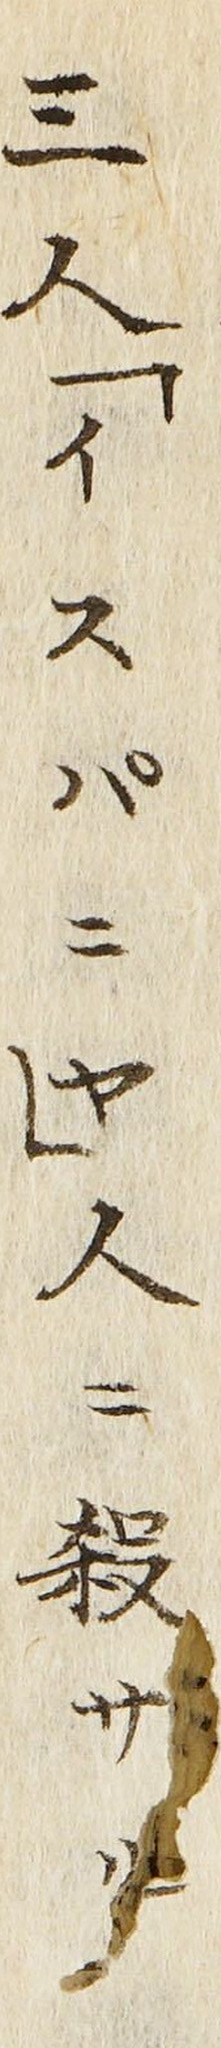三人「イスパニヤ」人ニ殺サル
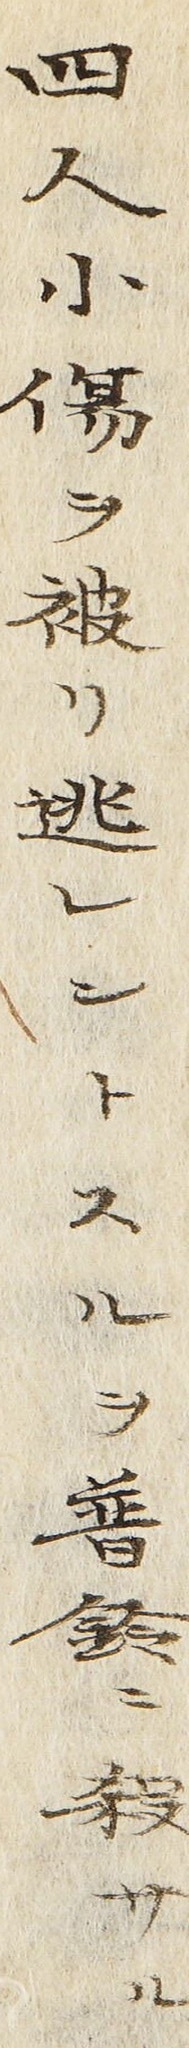四人小傷ヲ被リ逃レントスルヲ普鈴ニ殺サル
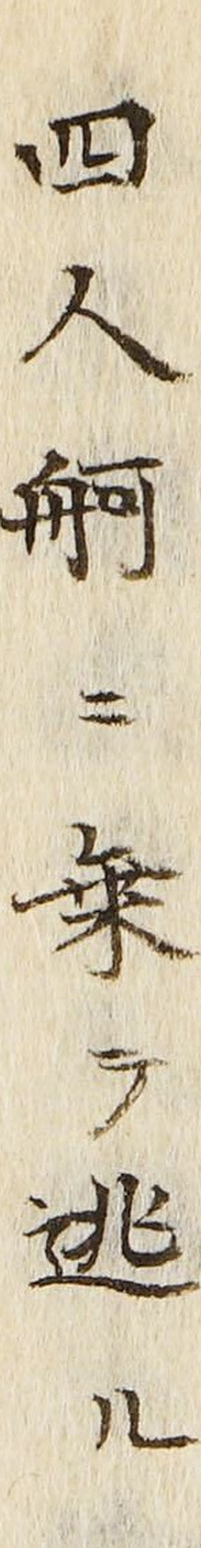四人舸ニ乗テ逃ル
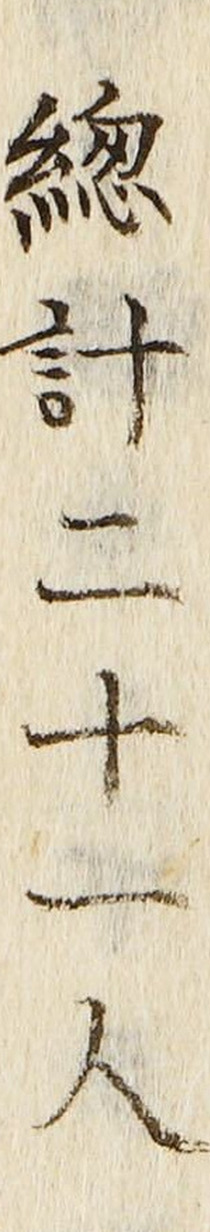総計二十一人
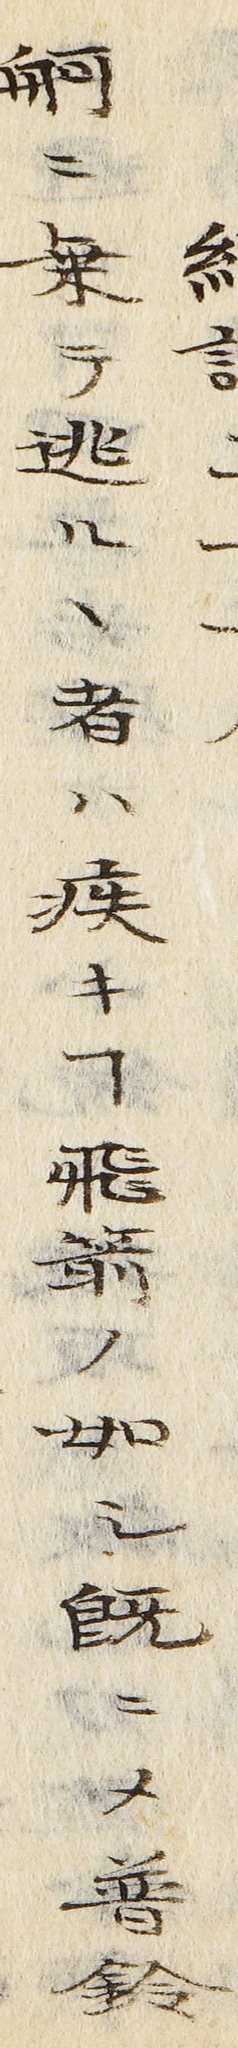舸ニ乗テ逃ルヽ者ハ疾キコト飛箭ノ如シ既ニシテ普鈴
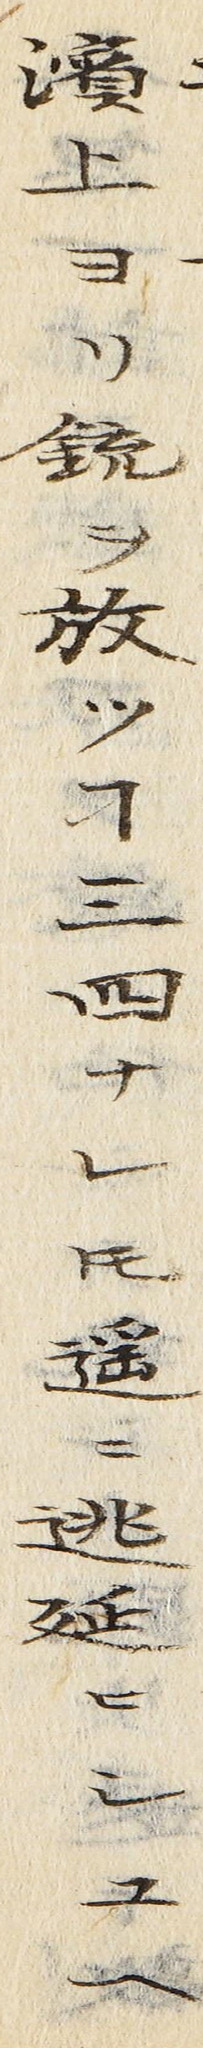浜上ヨリ銃ヲ放ツコト三四ナレトモ遙ニ逃延ヒシユヘ
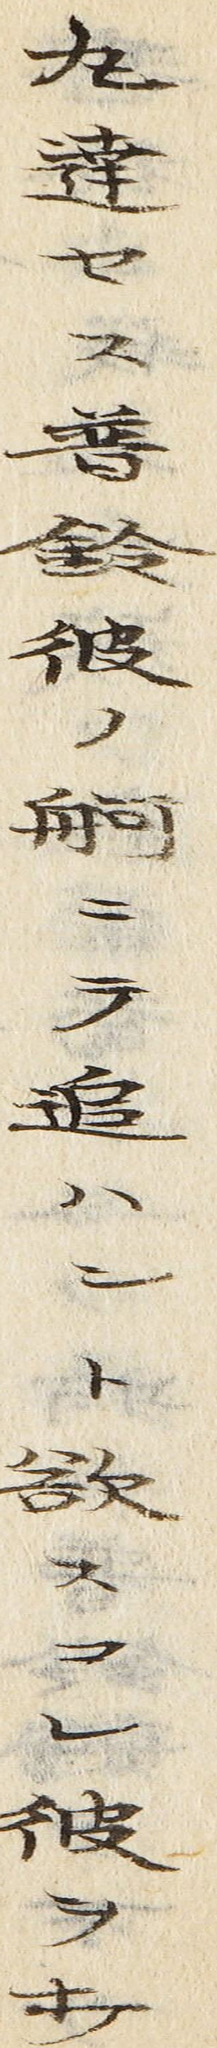丸達セス普鈴彼ノ舸ニテ追ハント欲スコレ彼ヲ打
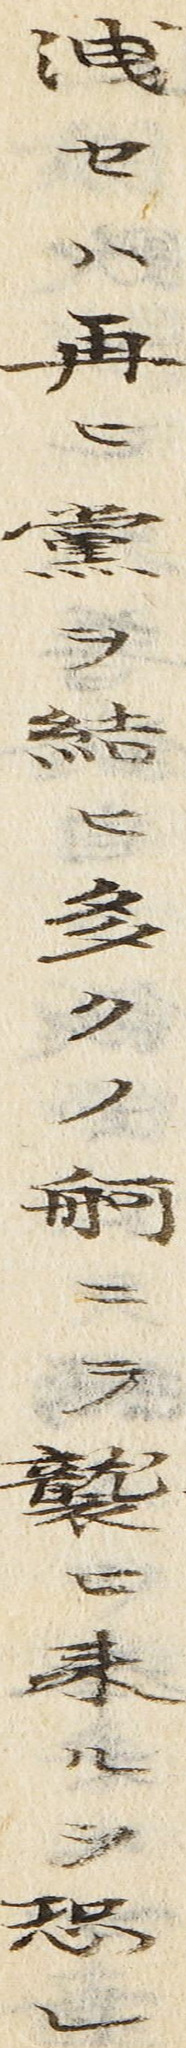洩セハ再ヒ党ヲ結ヒ多クノ舸ニテ襲ヒ来ルヲ恐レ
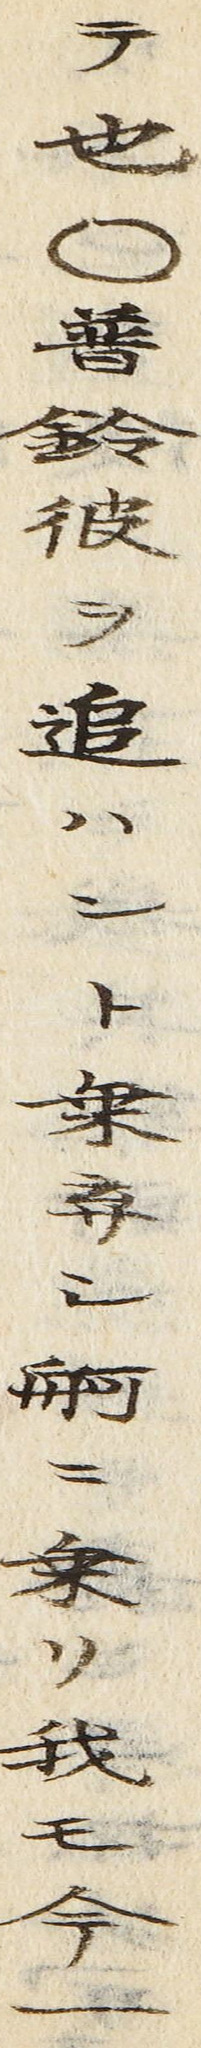テ也◯普鈴彼ヲ追ハント乗弃シ舸ニ乗リ我モ今一
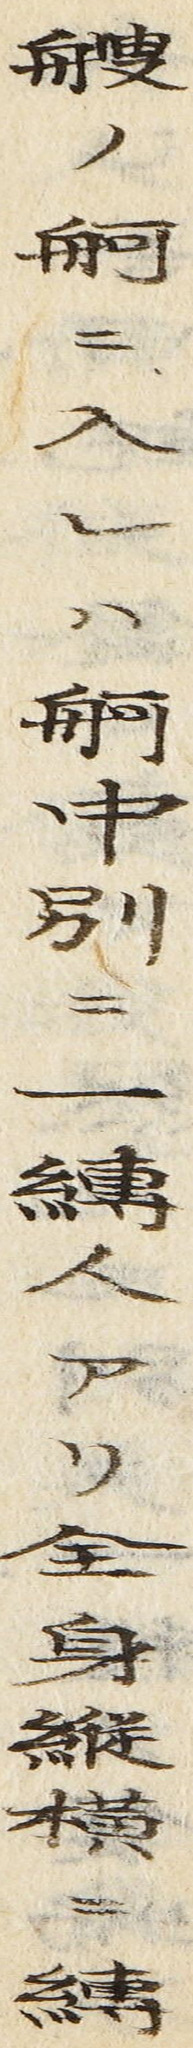艘ノ舸ニ入レハ舸中別ニ一縛人アリ全身縦横ニ縛
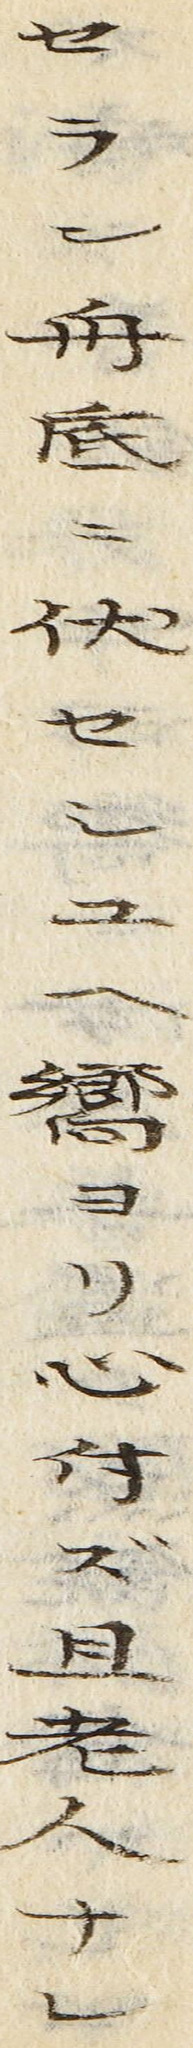セラン舟底ニ伏セシユヘ嚮ヨリ心付ズ且老人ナレ
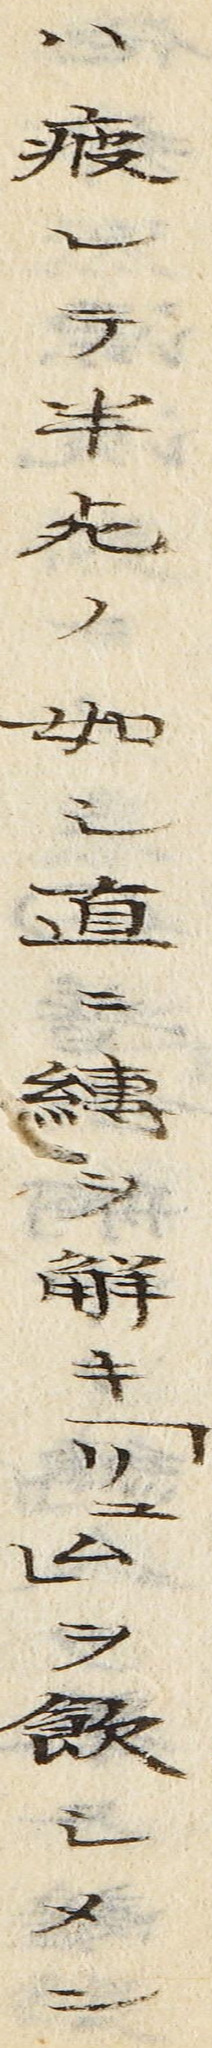ハ疲レテ半死ノ如シ直ニ縛ヲ解キ「リュム」ヲ飲シメン
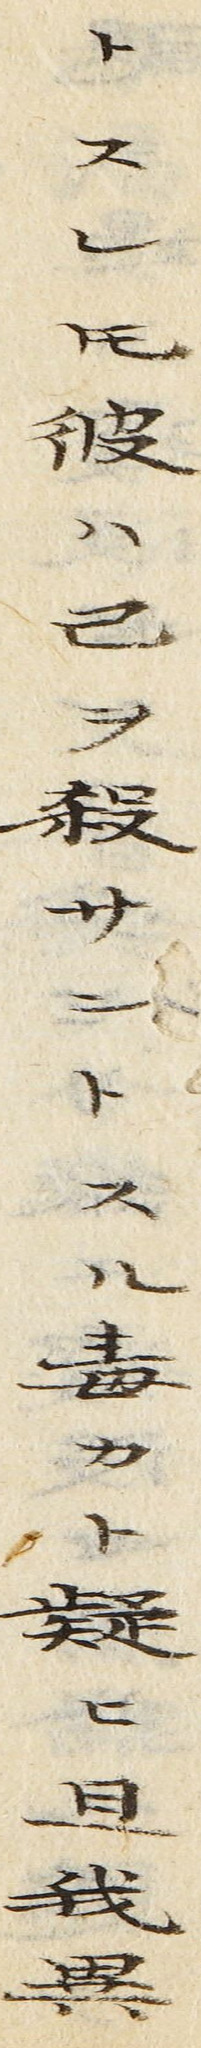トスレトモ彼ハ己ヲ殺サントスル毒カト疑ヒ且我異
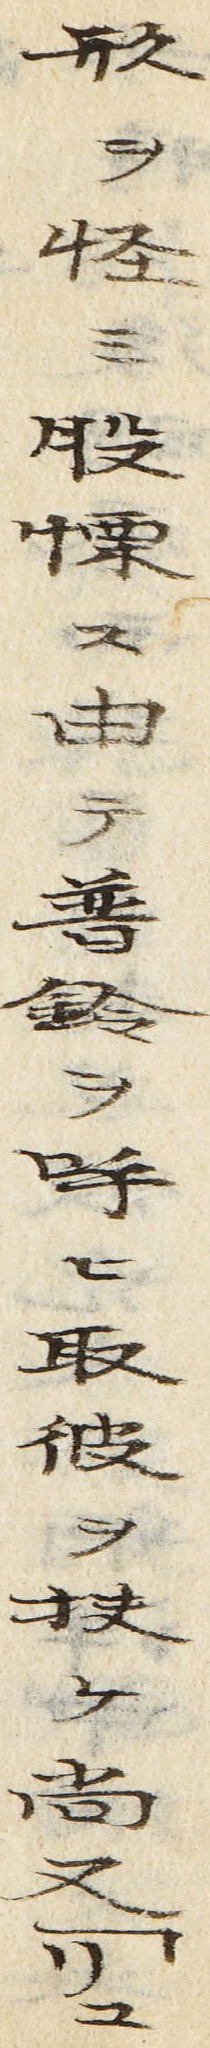形ヲ怪ミ股慄ス由テ普鈴ヲ呼ヒ取彼ヲ扶ケ尚又「リュ
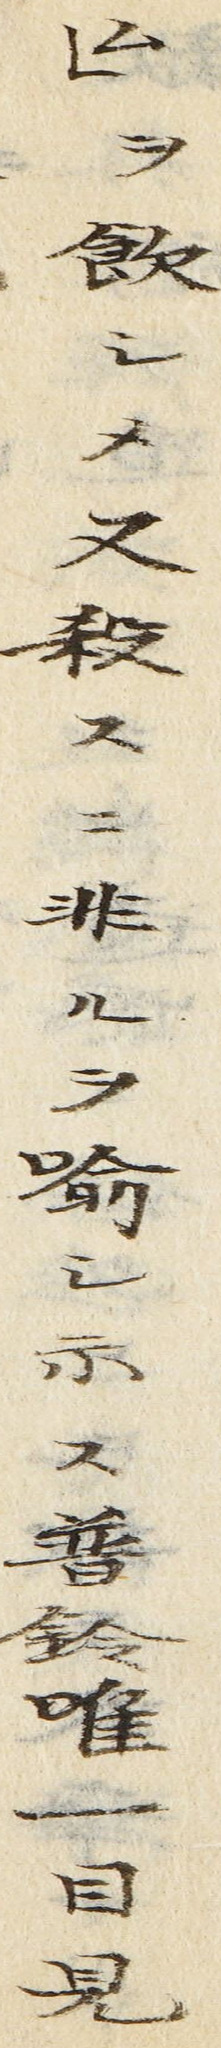ム」ヲ飲シメ又殺スニ非ルヲ喩シ示ス普鈴唯一目見
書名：漂流紀事
